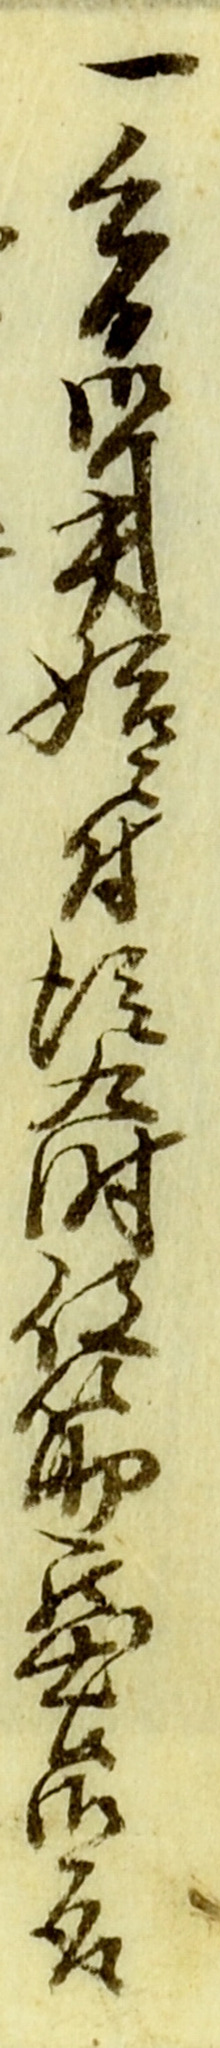一今日御用始ニ付従九時役筋罷出候御取
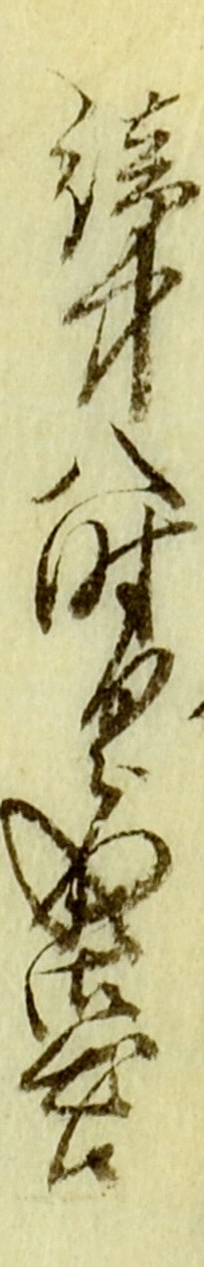締中八時ゟ被成御出候
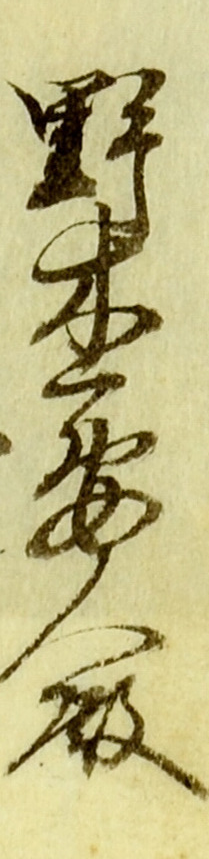野木要人殿
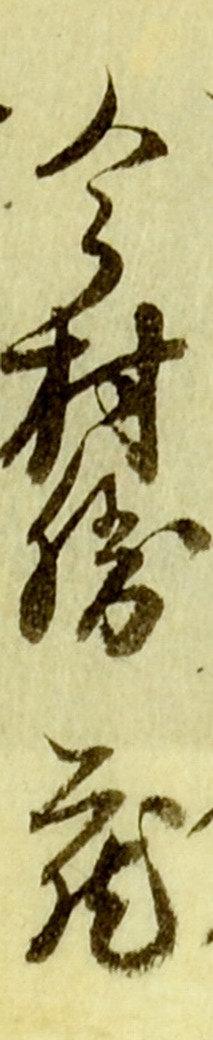今村勝蔵
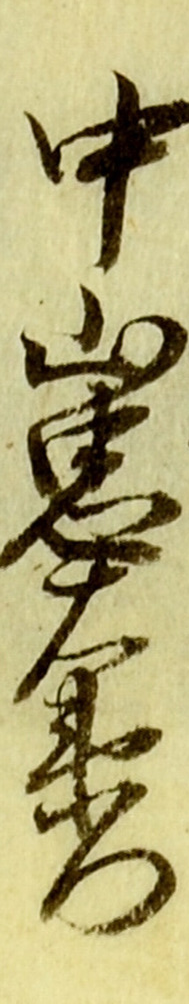中山忠右衛門
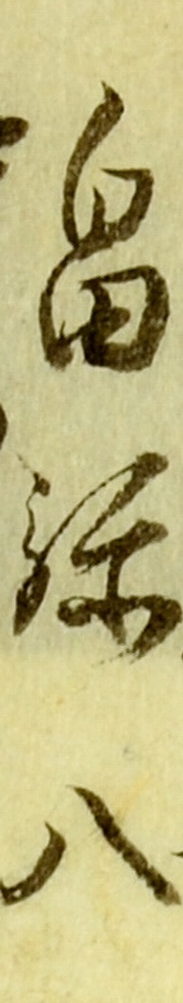畠弥八
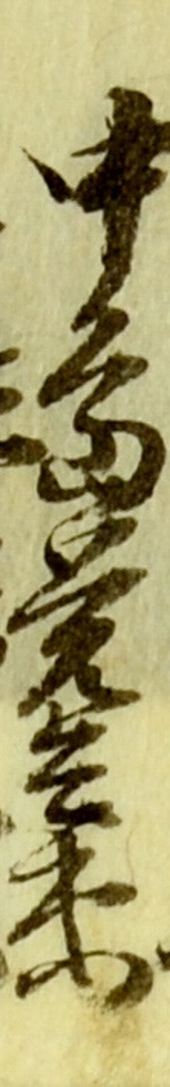中島覚兵衛
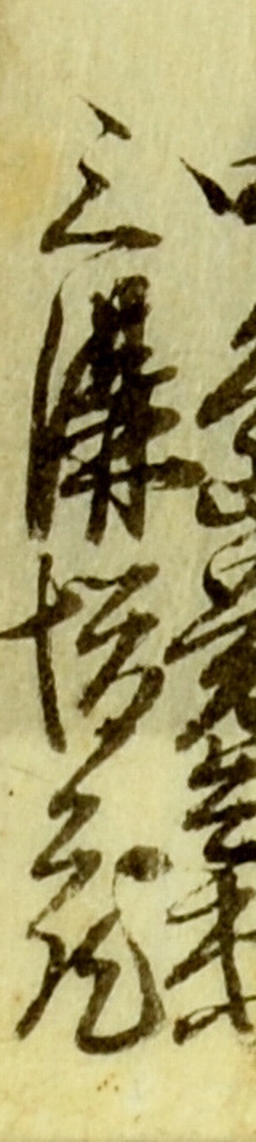三溝増蔵

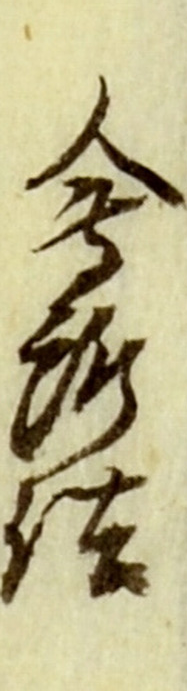会所詰
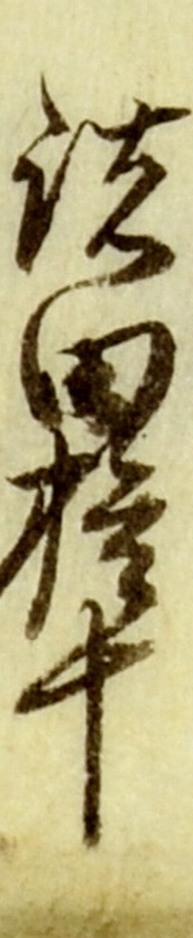諸田権十
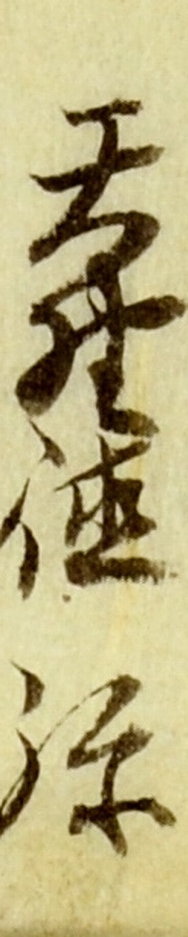天野徳弥
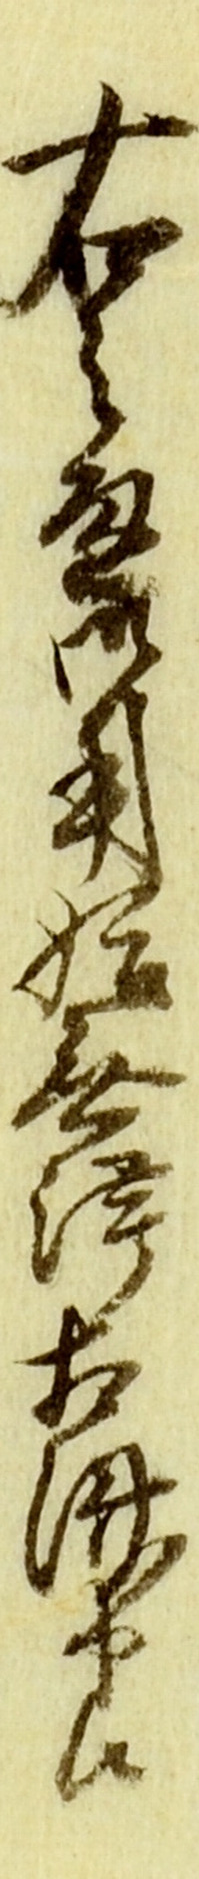右之通御用始無滞相済申候
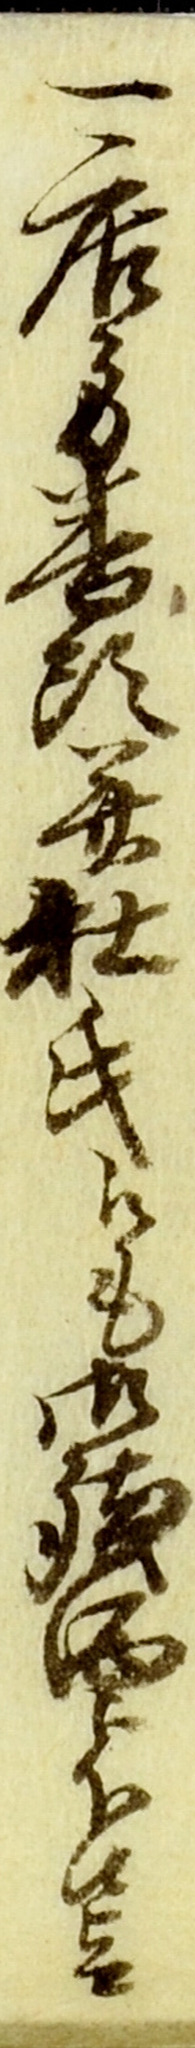一店方番頭幷杜氏江も御残酒被下旨
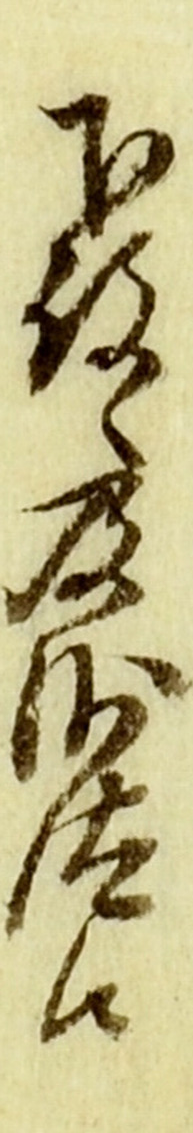下役へ及沙汰候
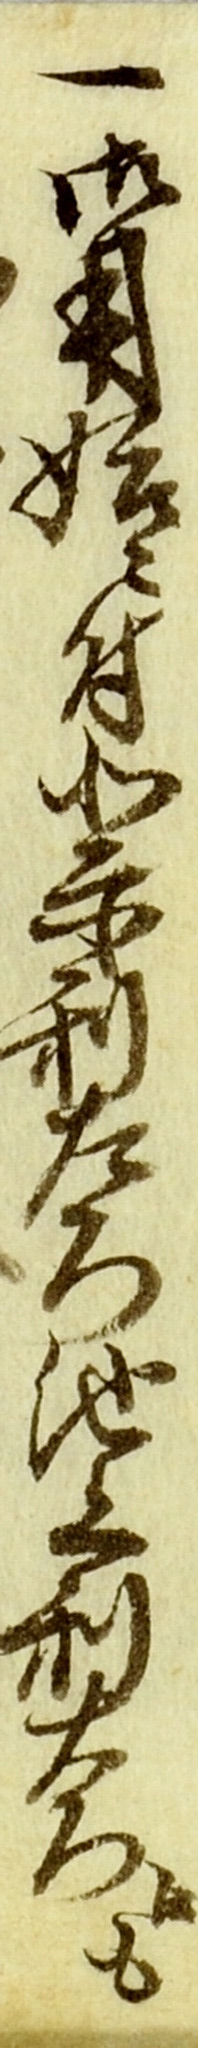一御用始ニ付北原利左衛門池上利右衛門江も
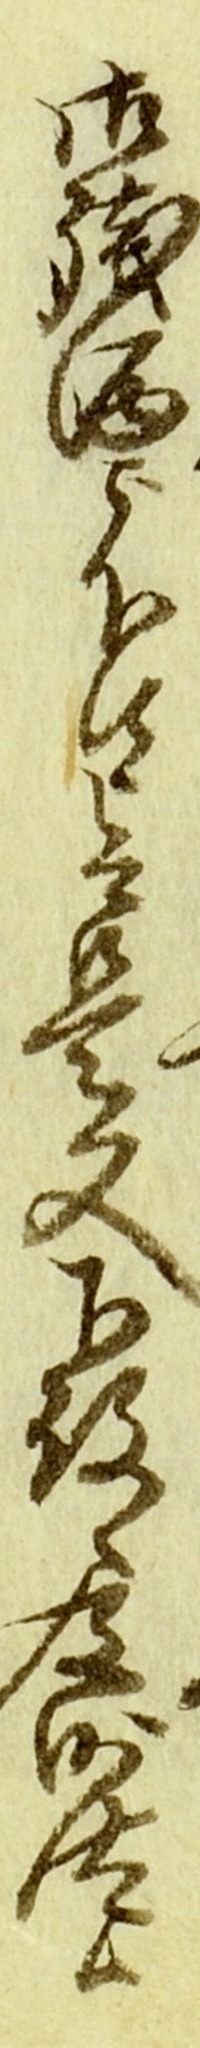御残酒被下候旨是又下役へ及沙汰候
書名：諸事御用留
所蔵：伊那市立高遠町図書館・合同会社AMANE
